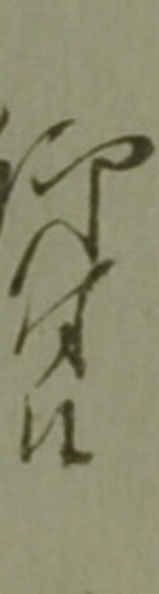仰付之
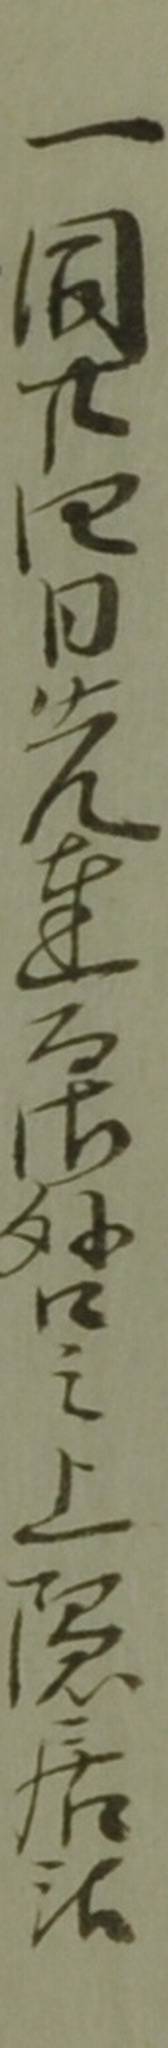一同廿四日先達而御咎之上隠居被
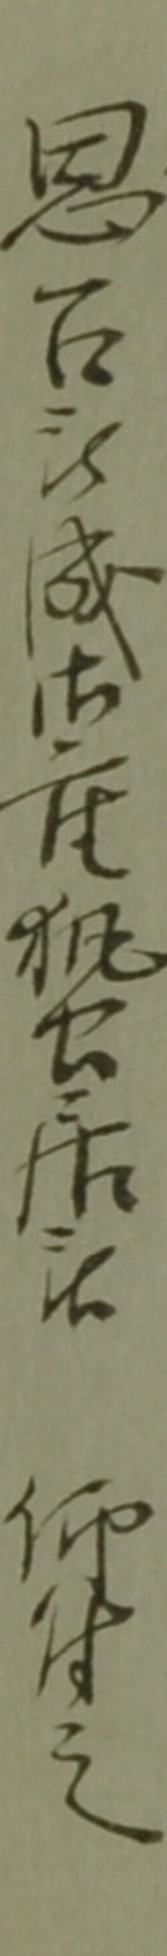思召被成御座蟄居被仰付之
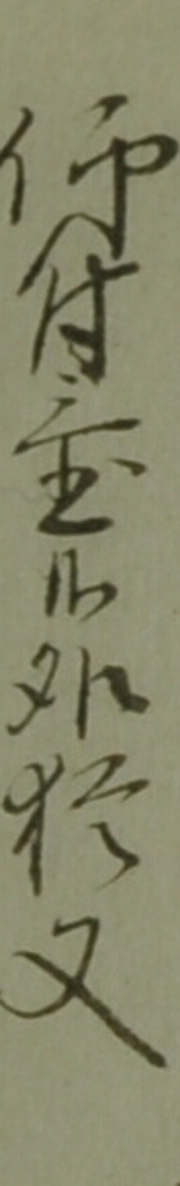仰付置候処猶又
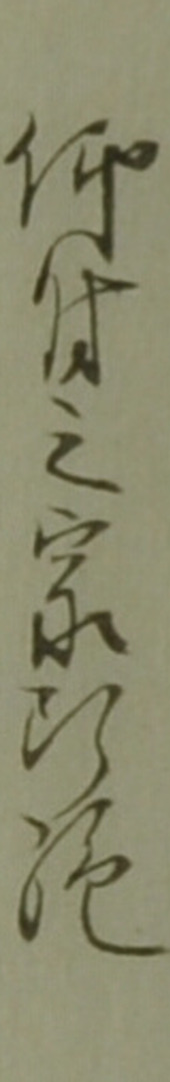仰付之家断絶
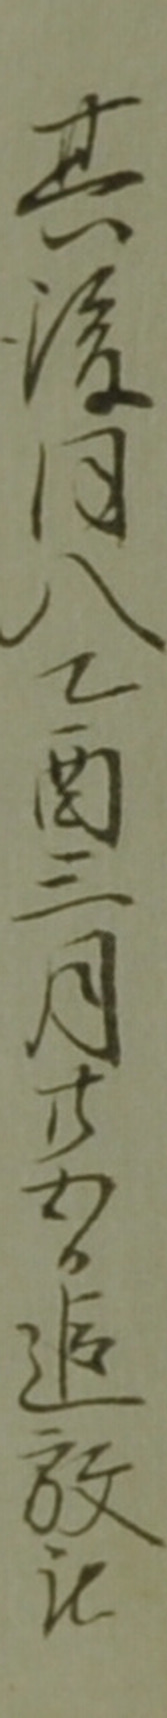其後同八乙酉三月廿五日追放被

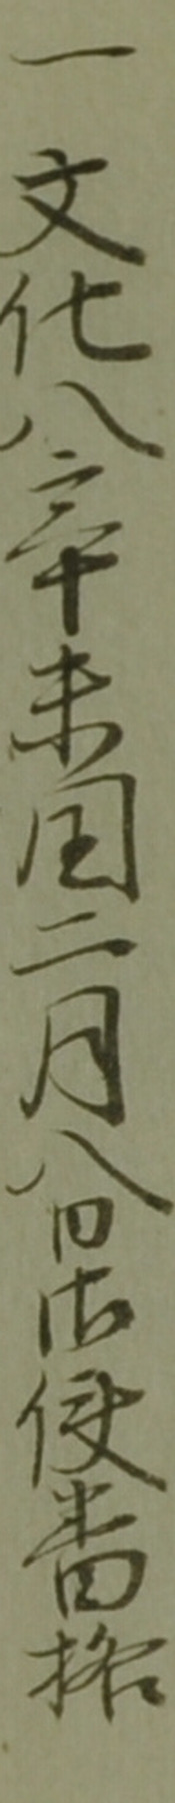一文化八辛未閏二月八日御使番格
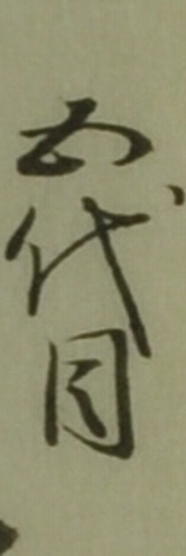五代目
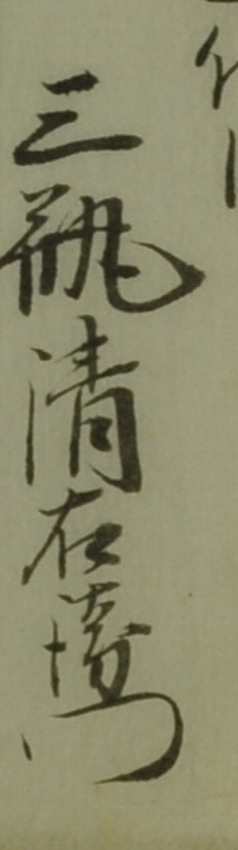三瓶清右衛門
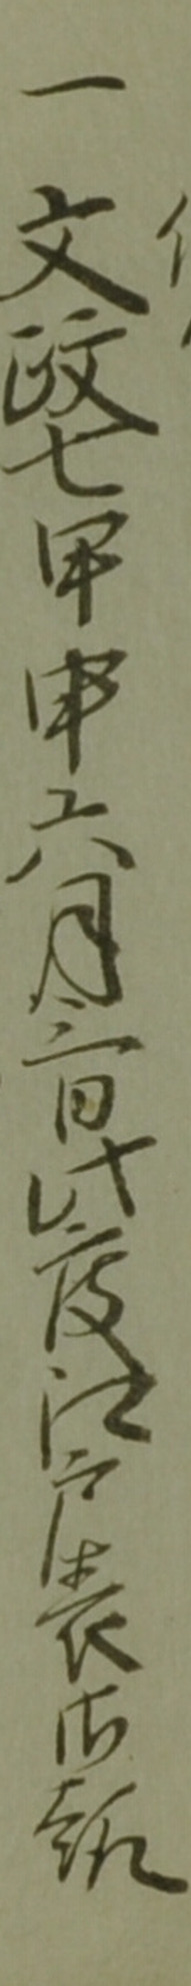一文政七甲申六月三日此度江戸表御趣
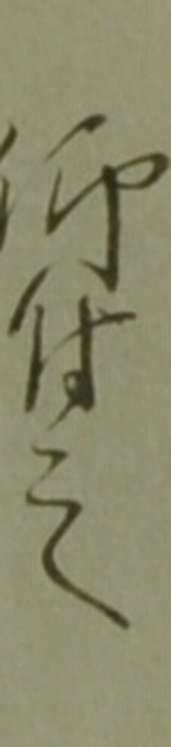仰付之
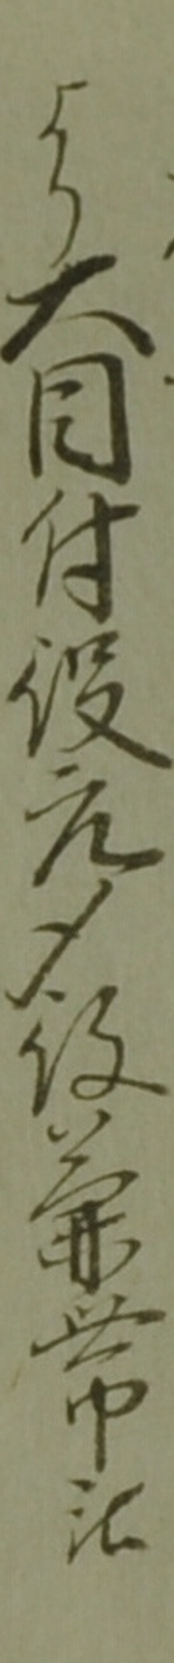より大目付役元〆役兼帯被
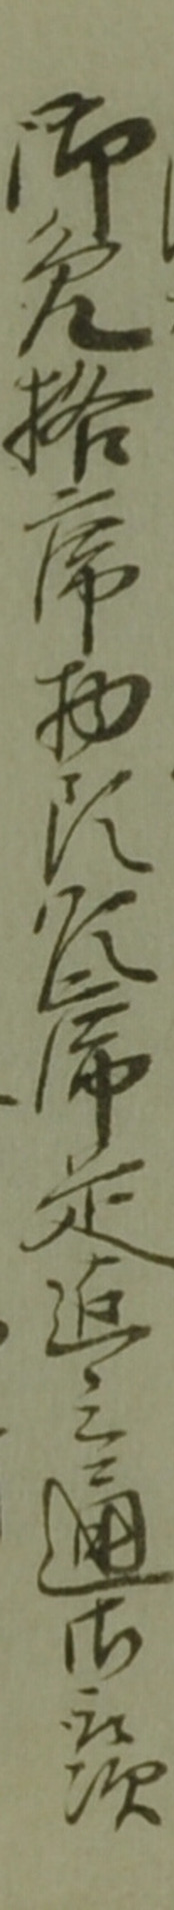御免格席物頭次席是迄之通御取次
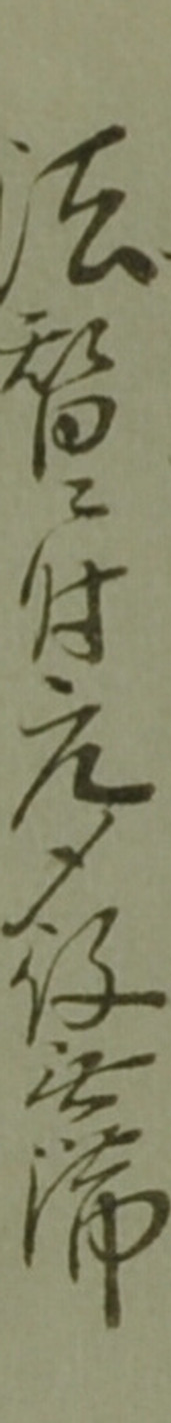法替付元〆役無滞
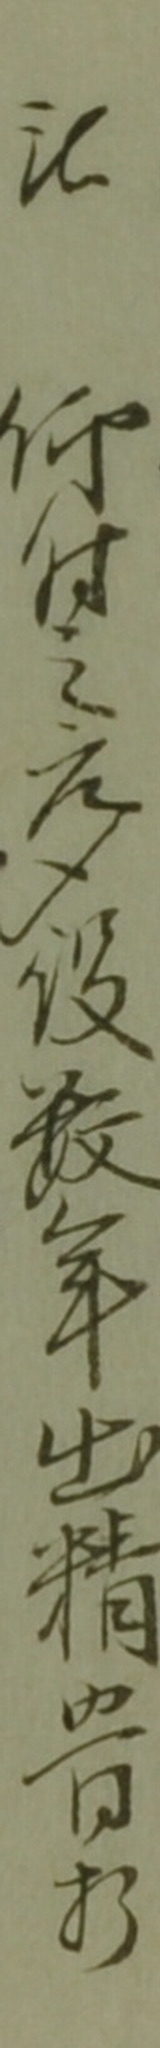被仰付之元〆役数年出精骨折
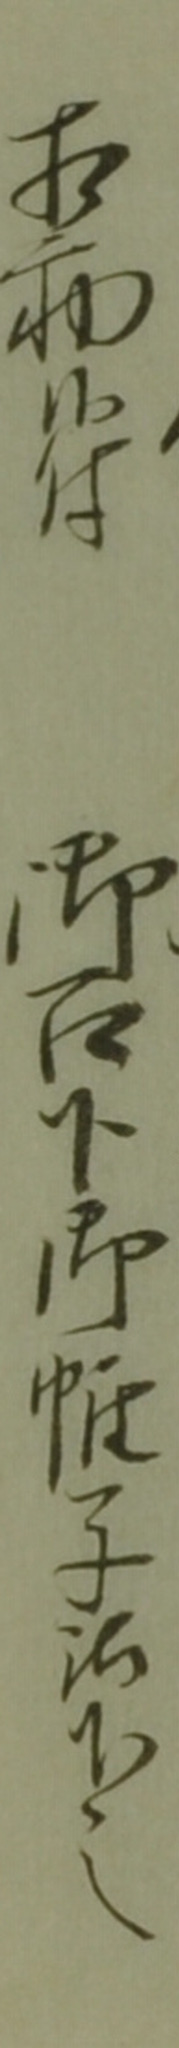相勤候付御召下御帷子被下之
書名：諸御役代々録（七）
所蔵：伊那市立高遠町図書館・合同会社AMANE
